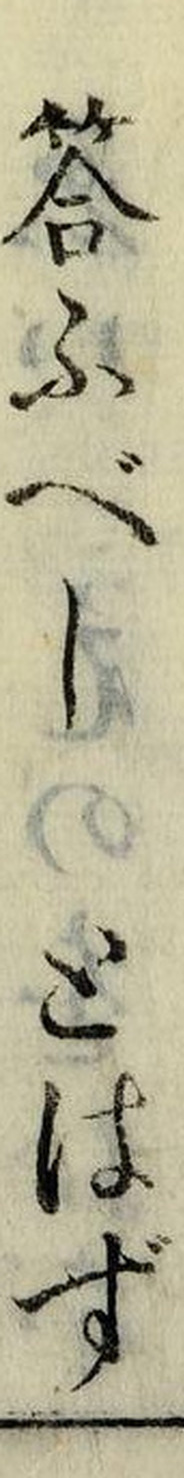ゞ答ふべしとはず
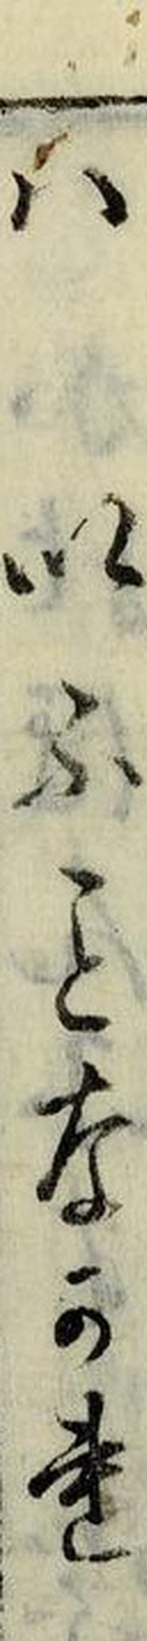はいふことなかれ
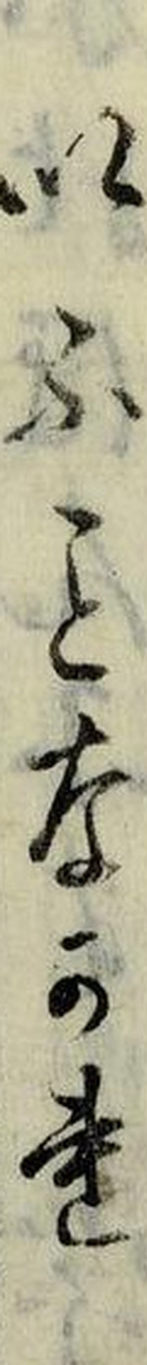はいふことなかれ
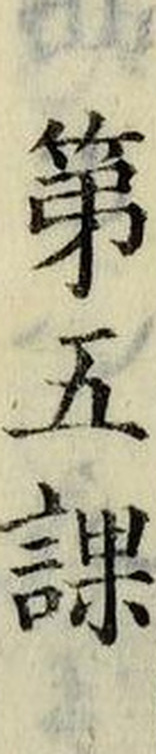第五課
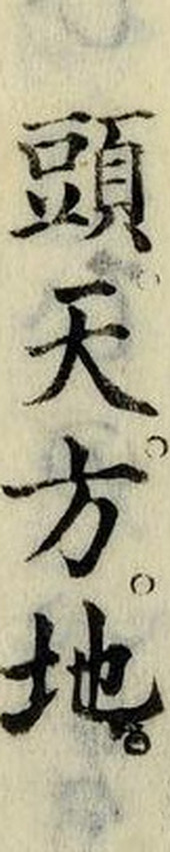頭。天。方。地。
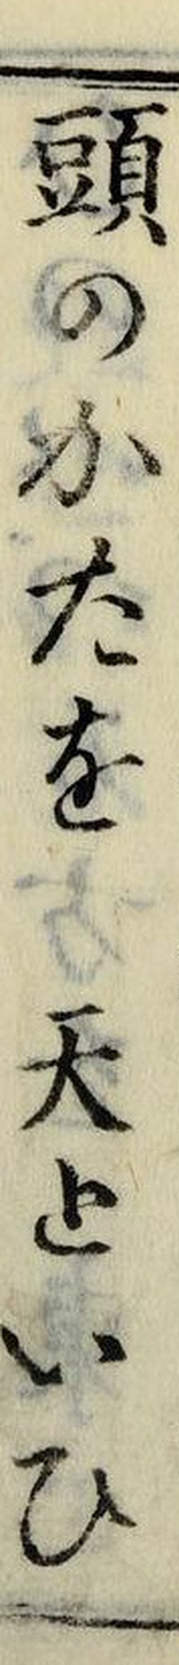頭のかたを天といひ
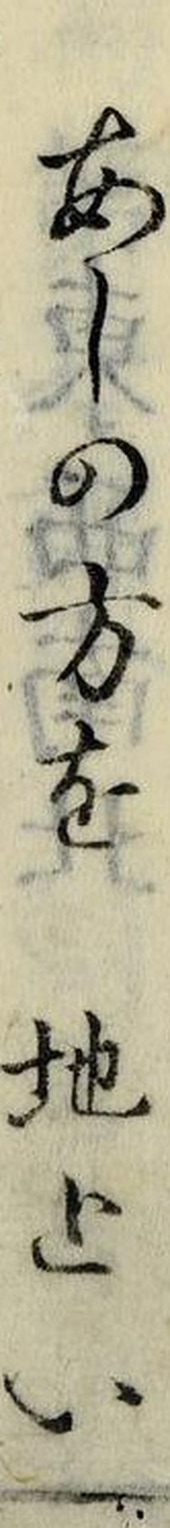あしの方を地とい
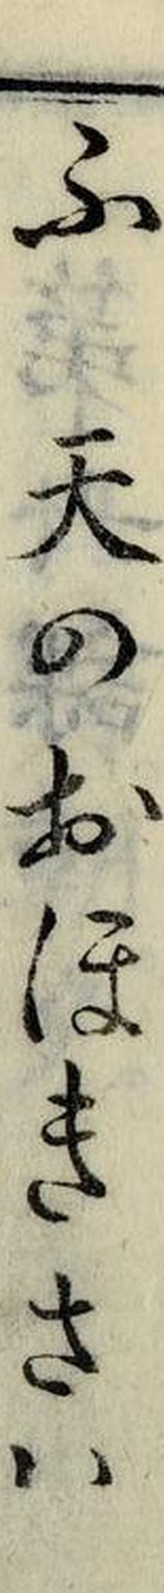ふ天のおほきさは
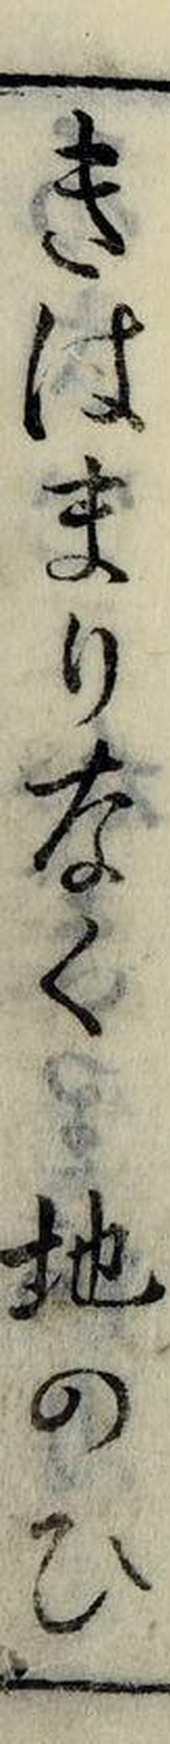きはまりなく地のひ

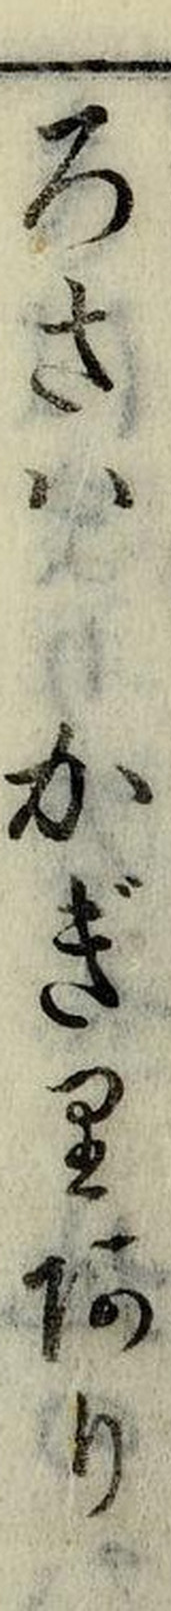ろさはかぎりあり
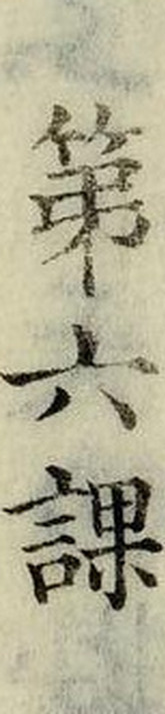第六課
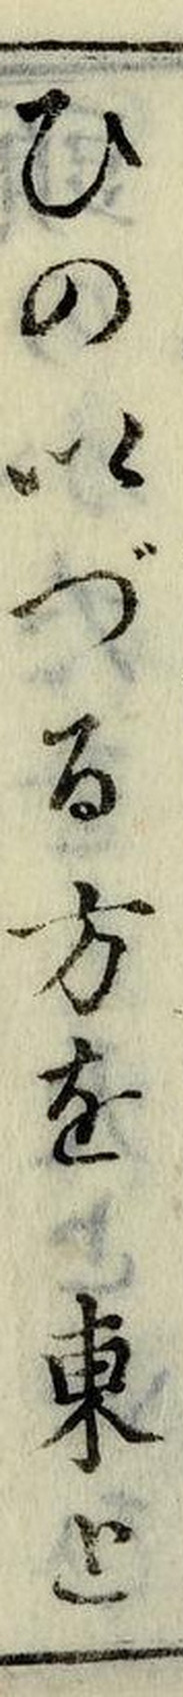ひのいづる方を東と
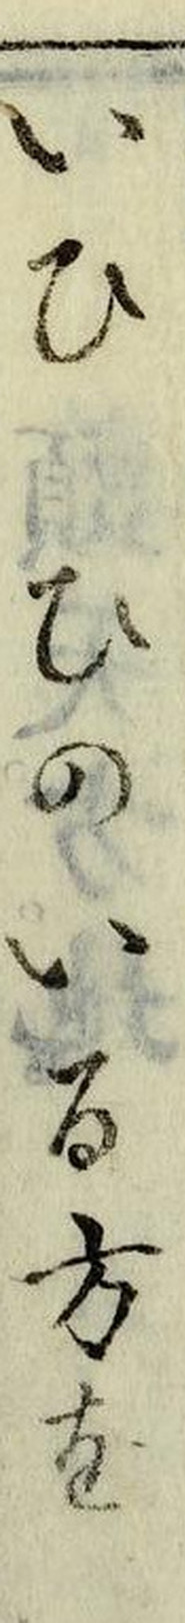いひひのいる方を
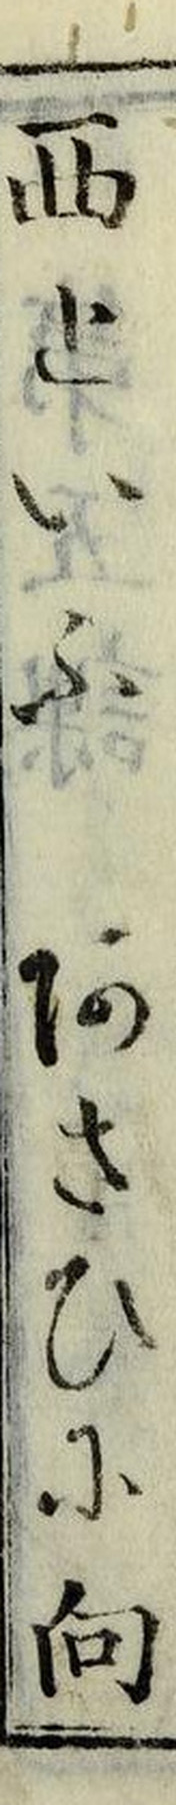西といふあさひに向
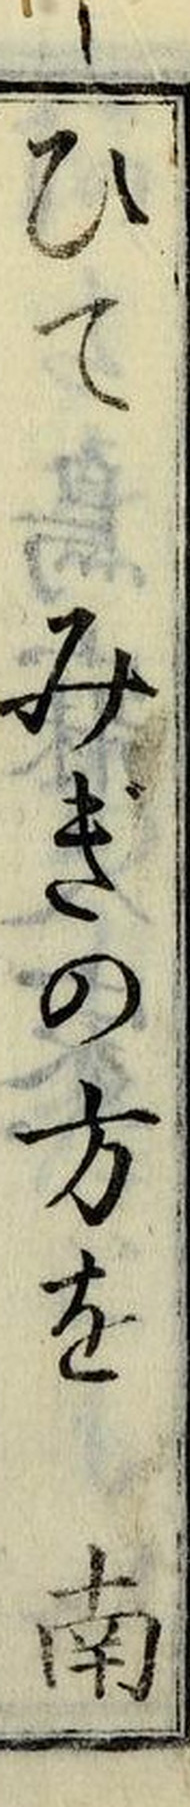ひてみぎの方を南
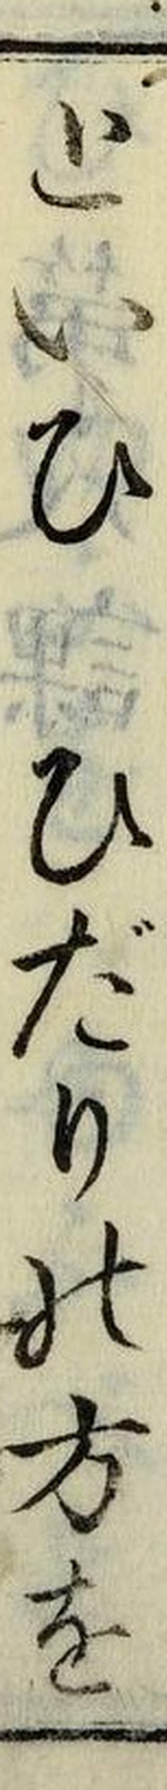といひひだりの方を
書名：小学読本 初等科 巻一
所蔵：福井県文書館 Fukui Prefectural Archives
